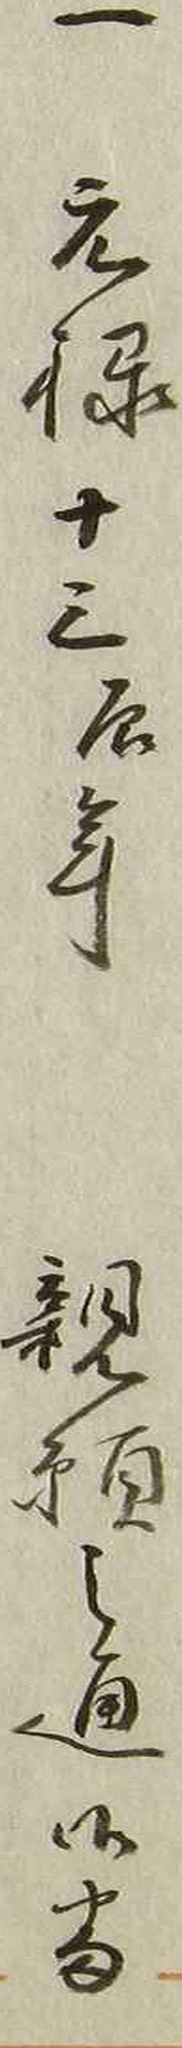一元禄十三辰年親願之通御番
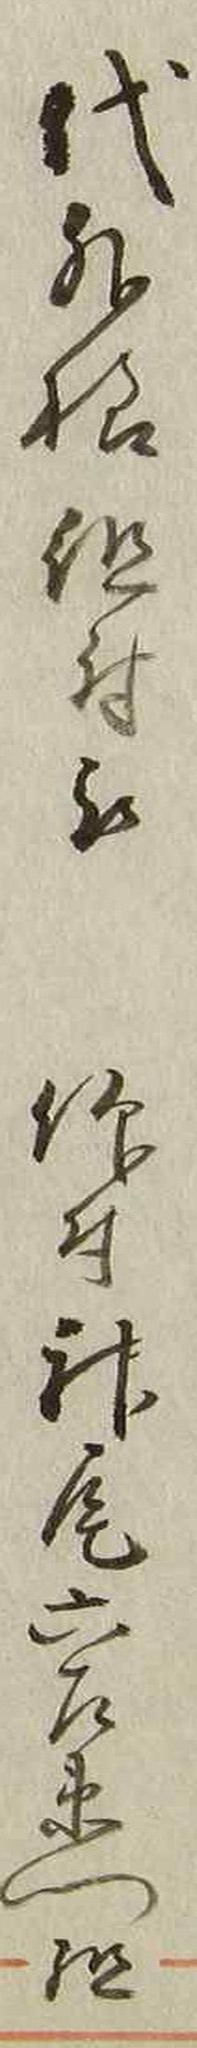代外様組付被仰付神尾六左衛門組
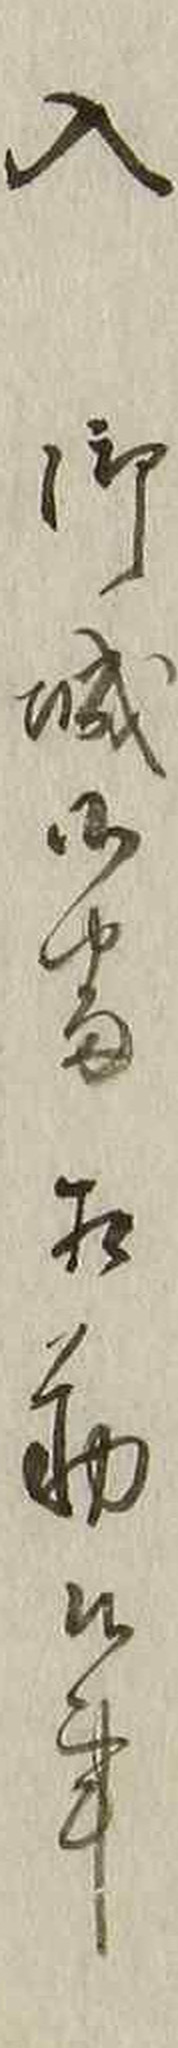入御城御番相勤候事
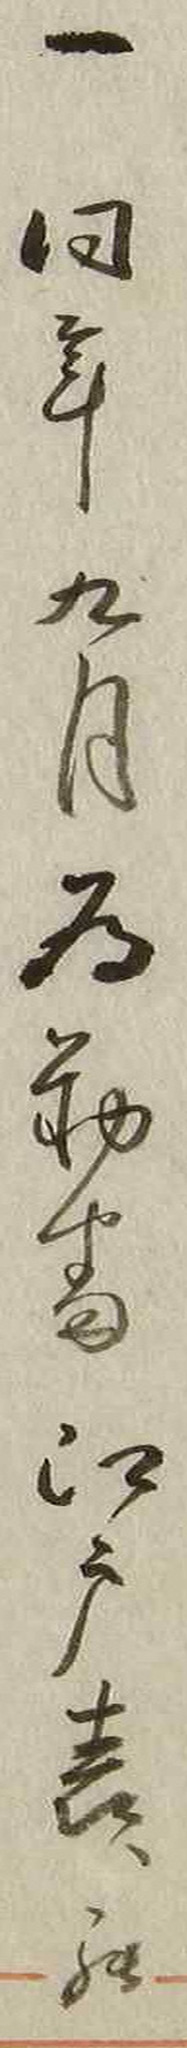一同年九月為勤番江戸表へ罷
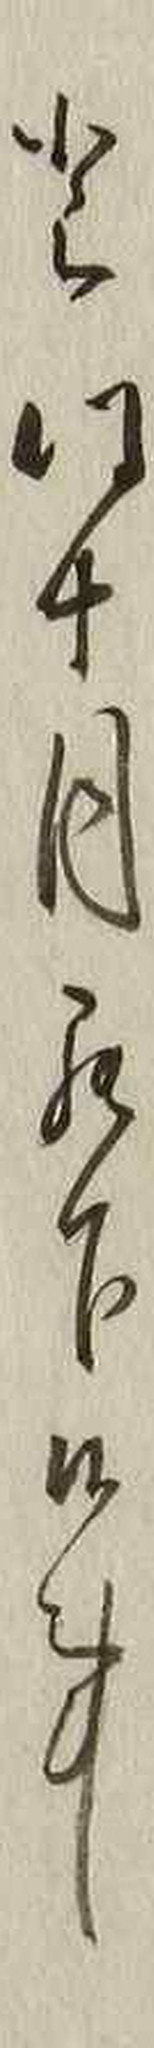登同十月罷下候事
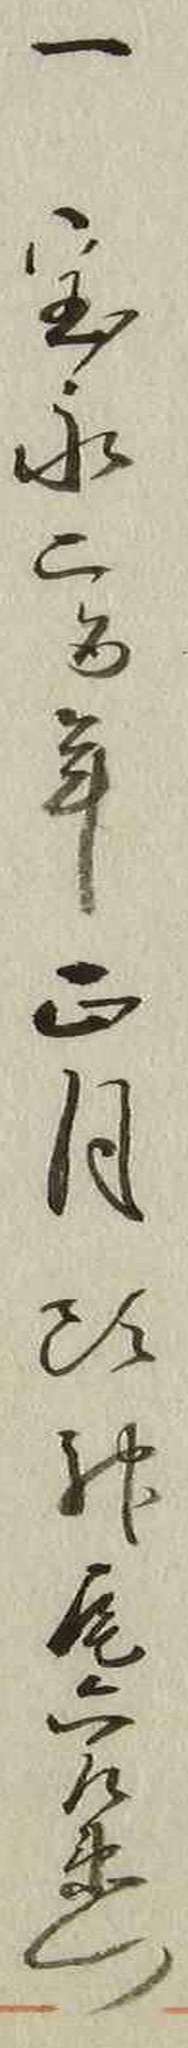一宝永二酉年正月頭神尾六左衛門
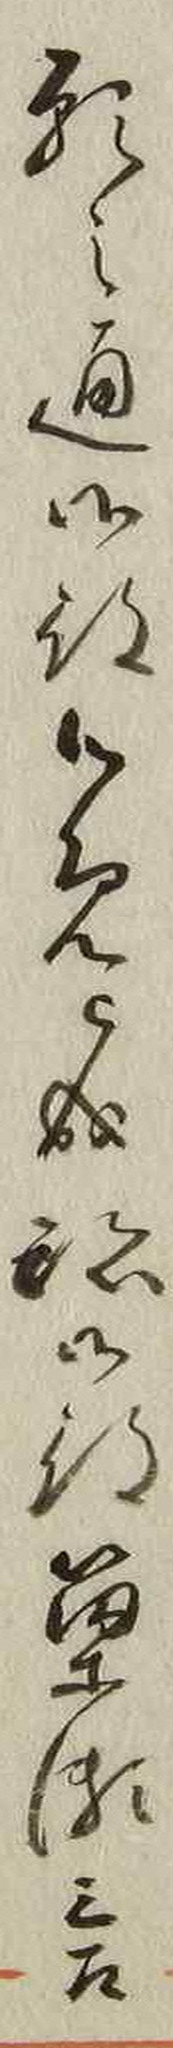願之通御御役御免被成跡御役簗瀬三左
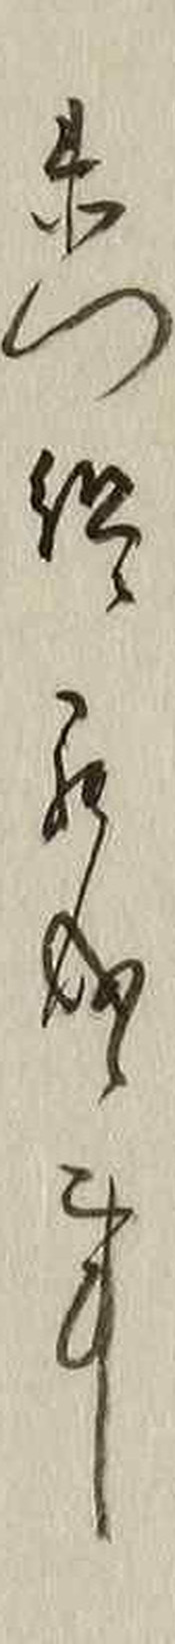衛門組に被成候事
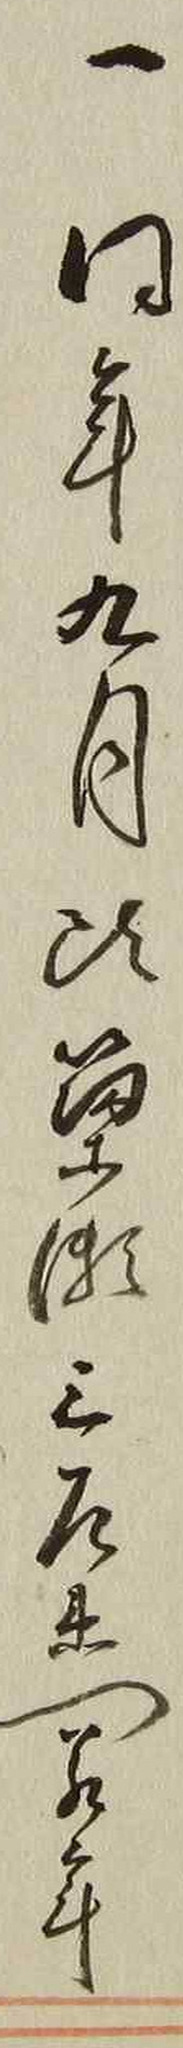一同年九月頭簗瀬三左衛門有若年
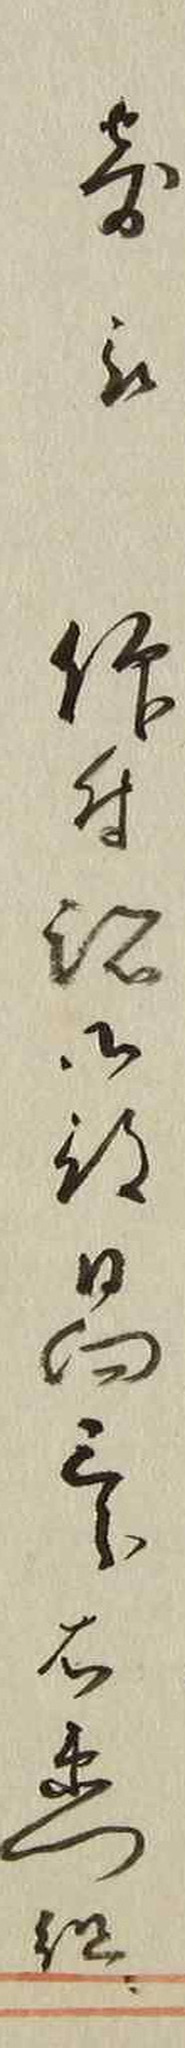寄被仰付所跡御役日向三郎右衛門組
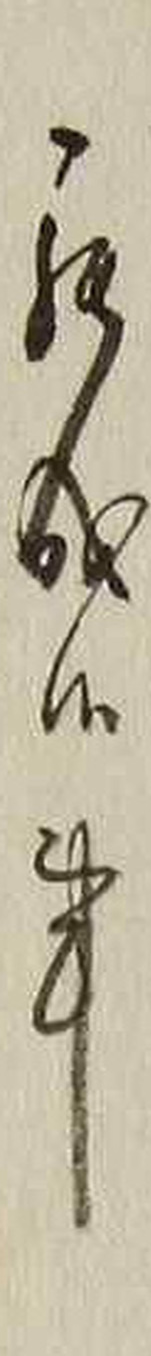被成候事
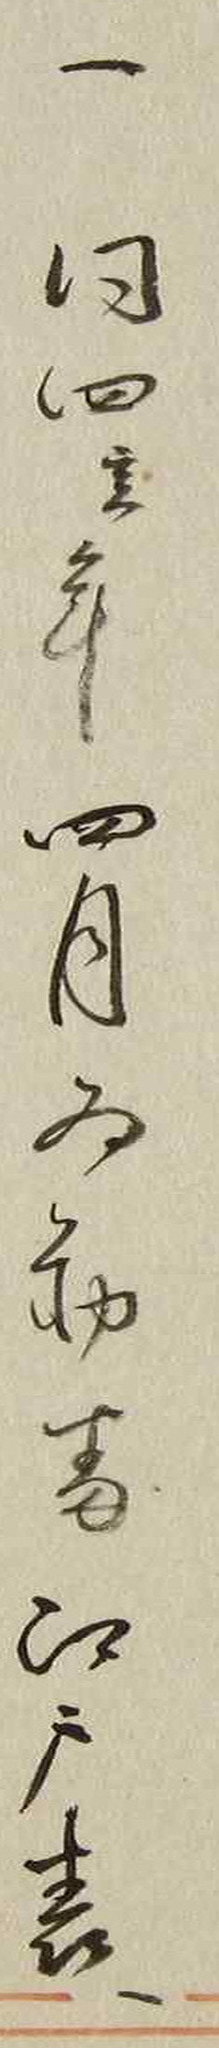一同四寅年四月為勤番江戸表
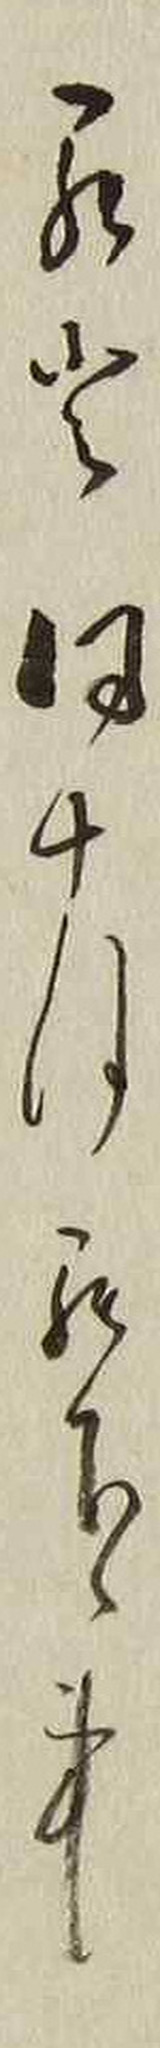登同十月罷下候事
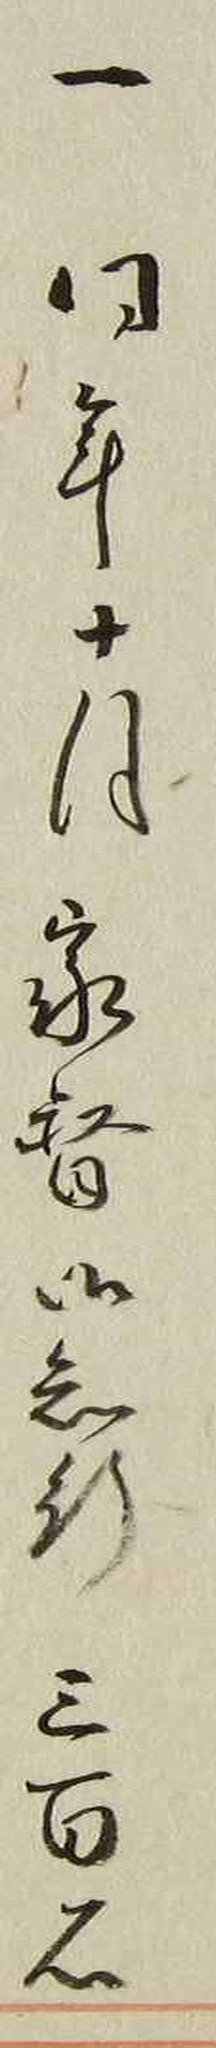一同年十月家督御知行三百石
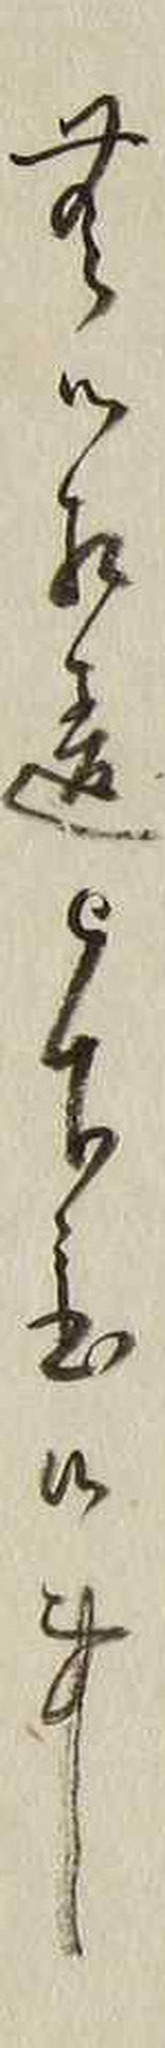無御相違被下置侯事
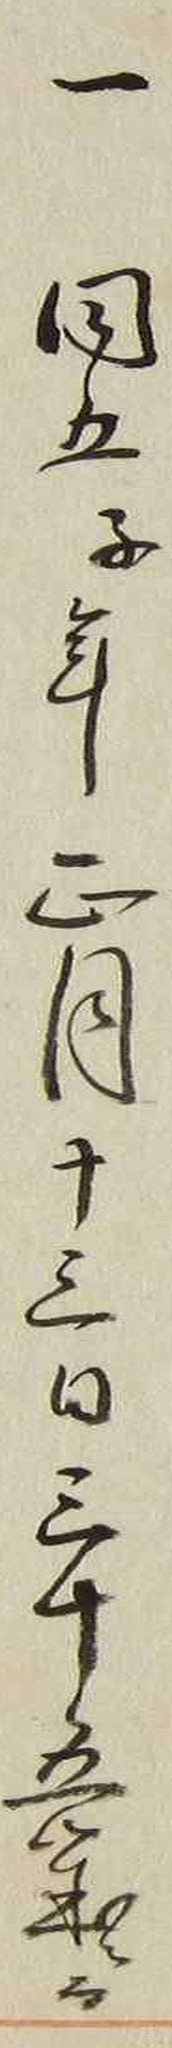一同五子年正月十三日三十五歳に而
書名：諸士系譜　巻之159　な之部1
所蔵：会津若松市立会津図書館
